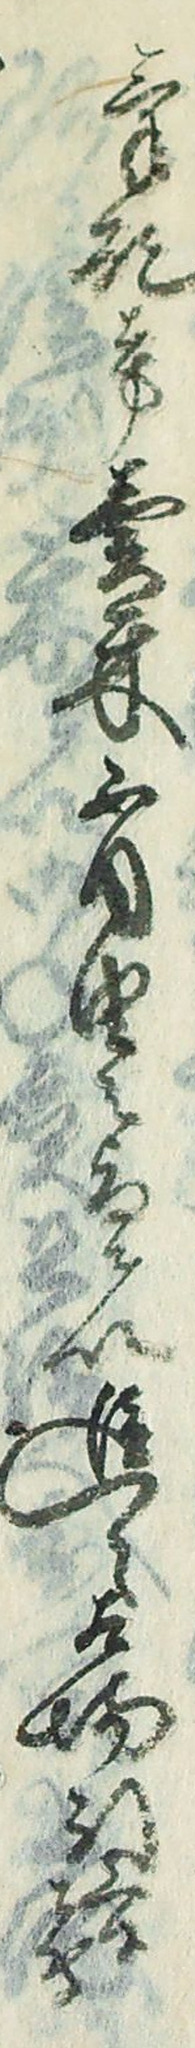氣配旁賣米不自由之旨ヲ以追々相場引上候ニ付
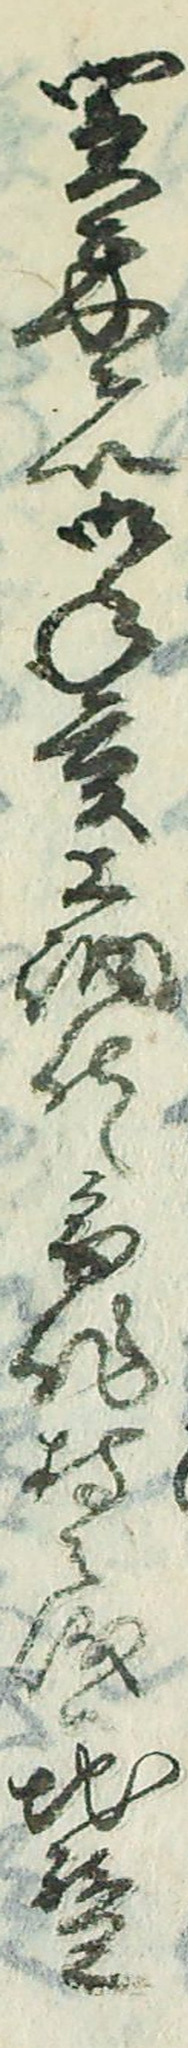買米ヲ以御年貢上納仕候畠作村之儀ハ地盤
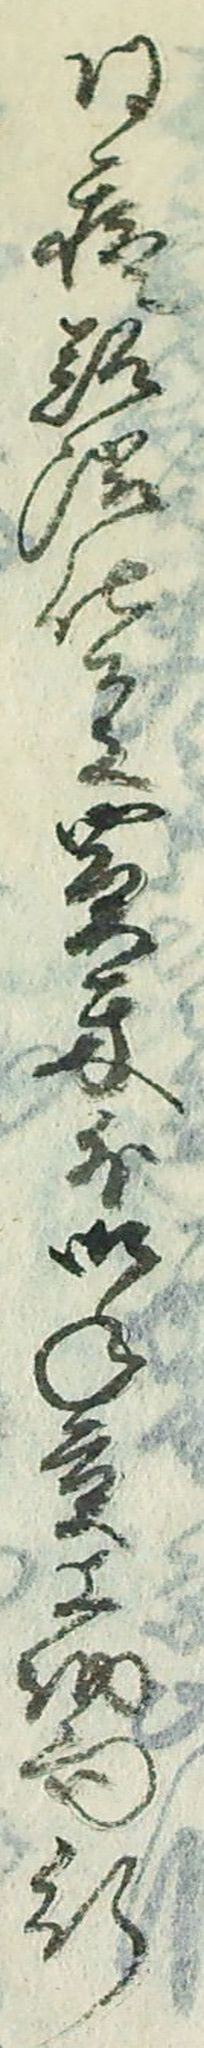同疼難渋仕候上買米外御年貢上納向行
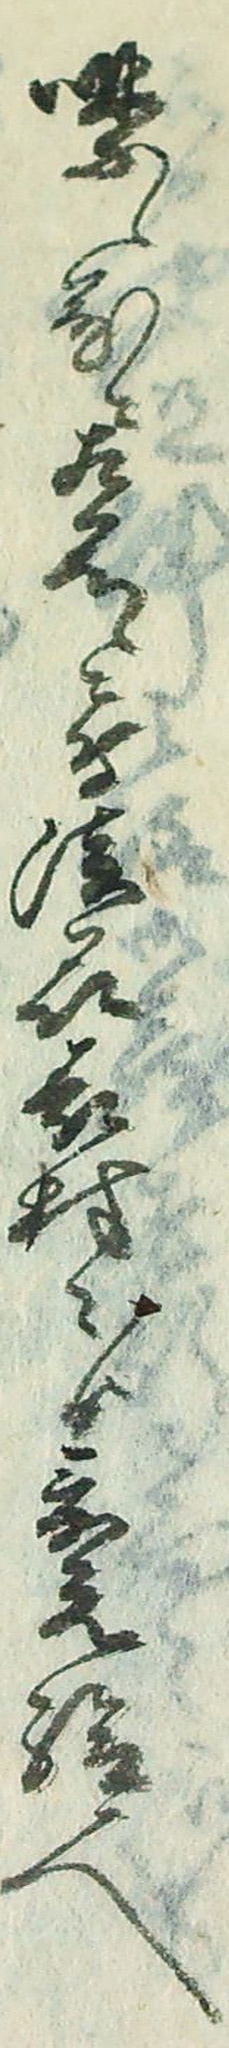噤候懸ニ相見候ニ付淡州表村々ゟ爰元給人
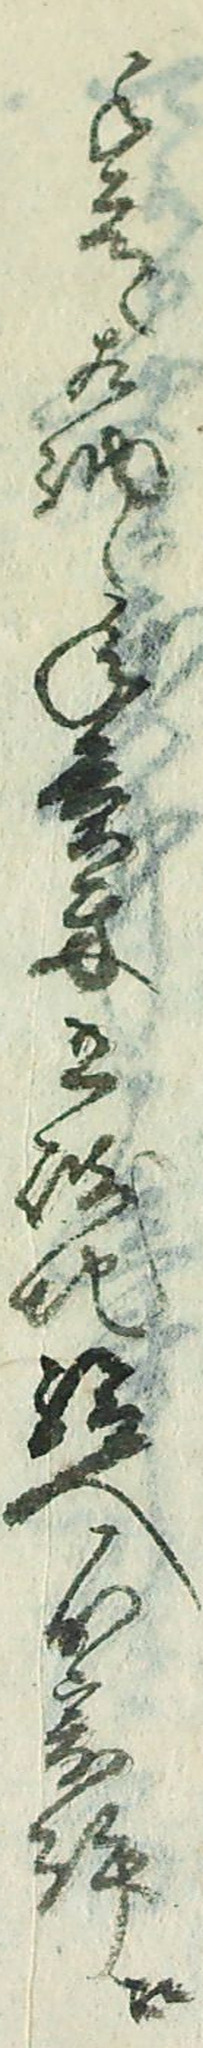手元へ相納候年貢米且彼地給人ゟ爰許江
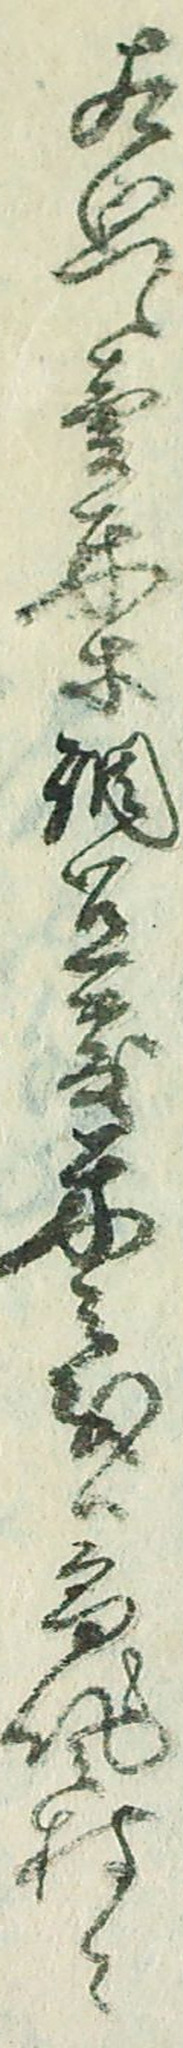相廻候賣米等調宜敷米之義ハ畠作之村々
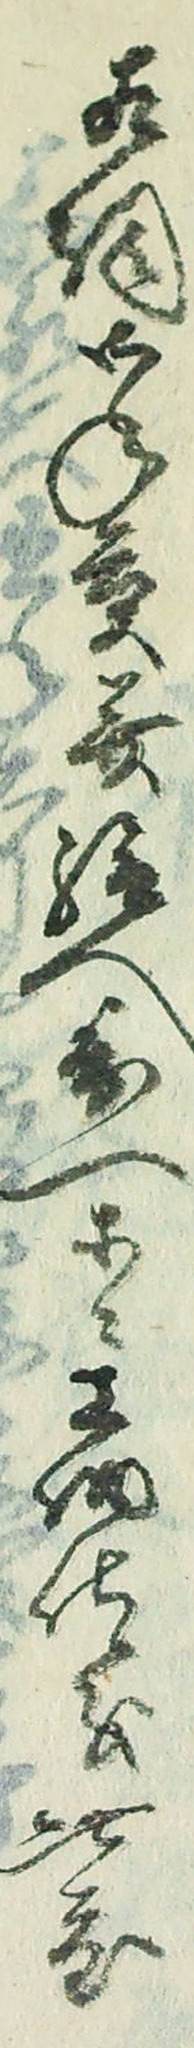相調御年貢幷給人歩一等ニ上納仕候義此度
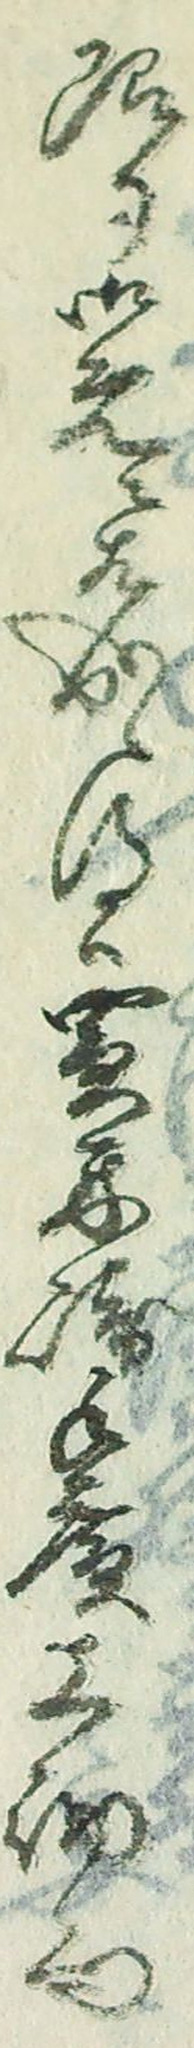限り御免ニ相成候得ハ買米崎手廣上納向
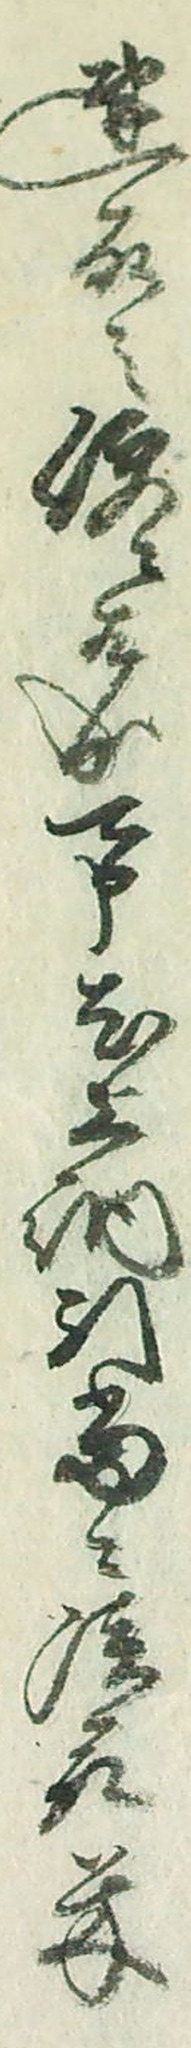速取之便ニ相成可申尤上納引當ニ淡州米
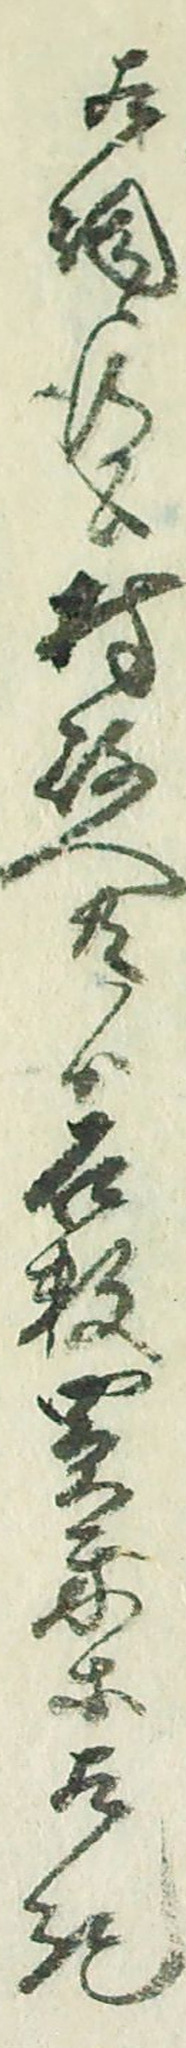相調候得ハ村役人共ゟ石数買米等相記
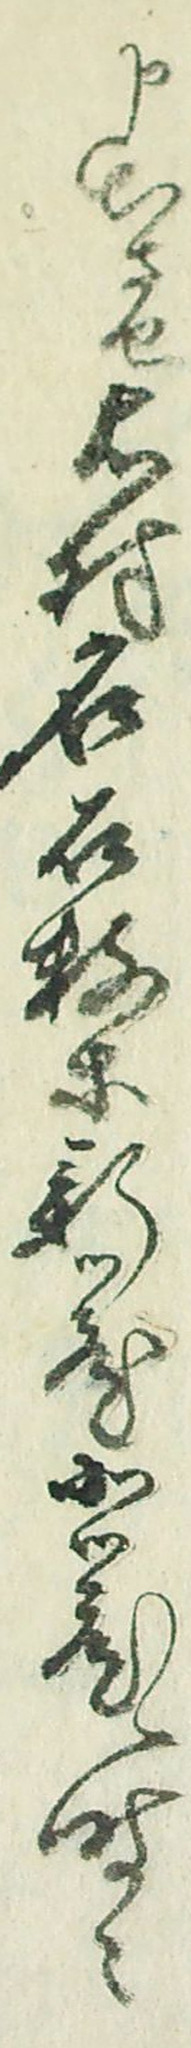申出させ右村名石数等新御蔵北御蔵へ時々
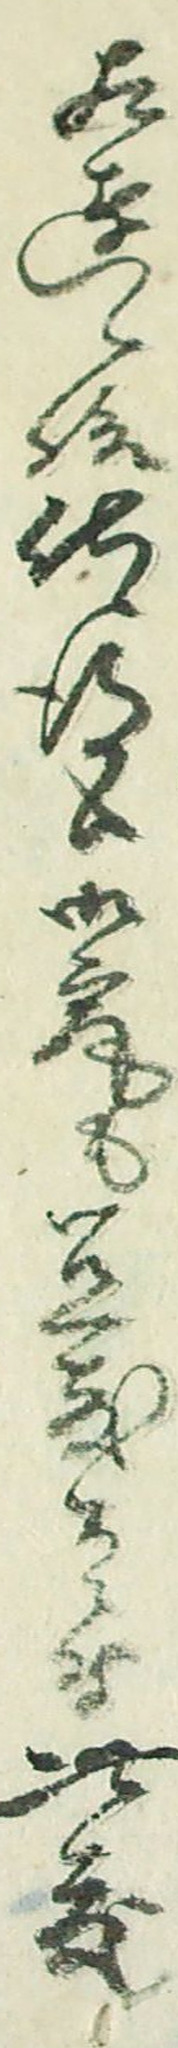相達し候様仕候得ハ御究も宜敷候ニ付此度
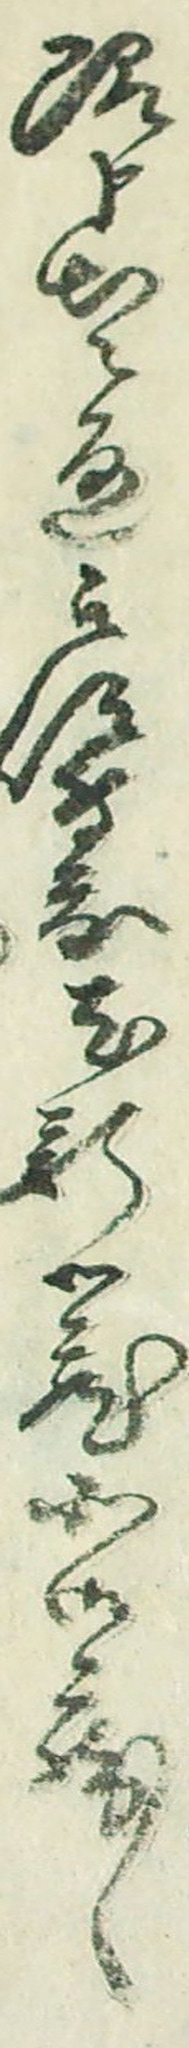限申出之通被仰付度尤新御蔵北御蔵へ
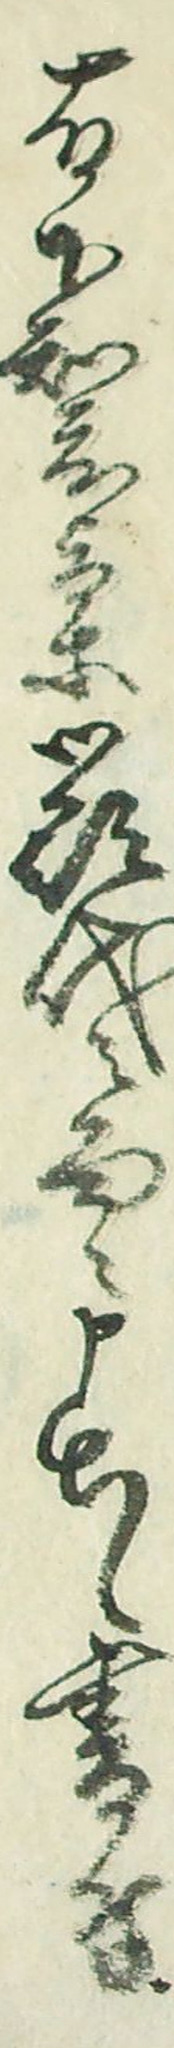有下知度旨等御郡代之面々申出候書付

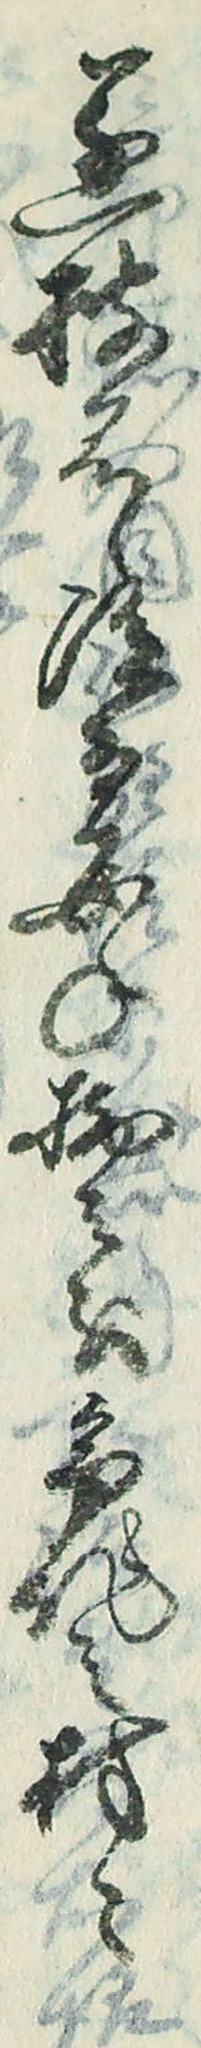遂披見候随而毎年柄之義畠作之村々
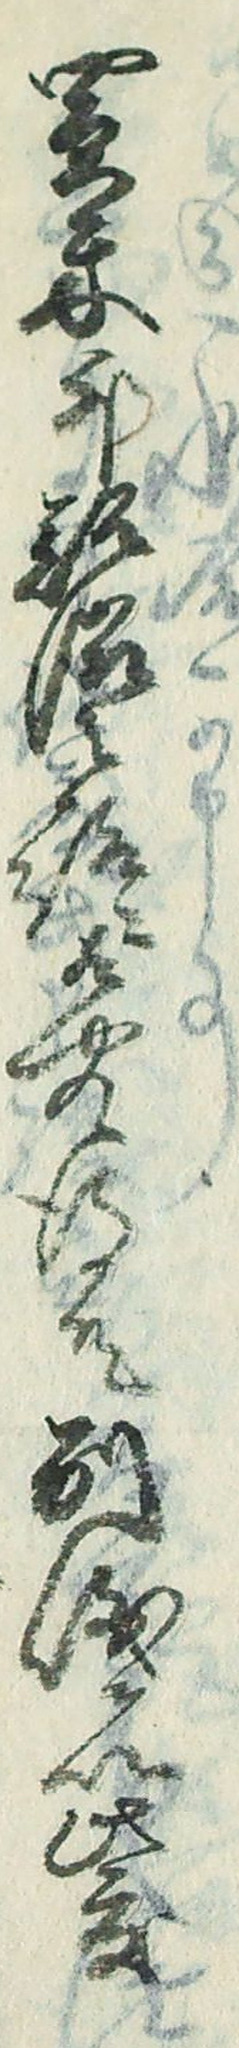買米外難渋之趣ニ相聞候得共別儀ヲ以此度
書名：諸御趣意書并御下知向之写
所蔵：鳴門教育大学 Naruto University of Education
